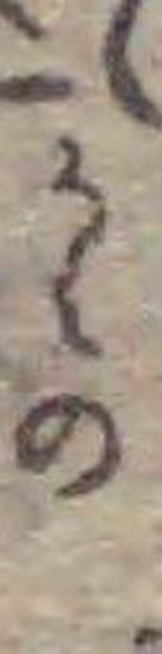かみの
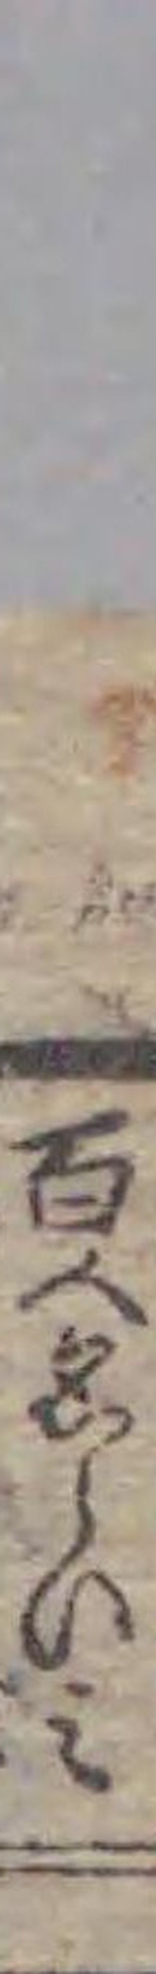百人ゑらひみ
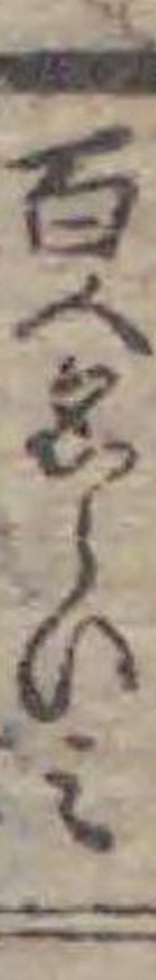百人ゑらひみ
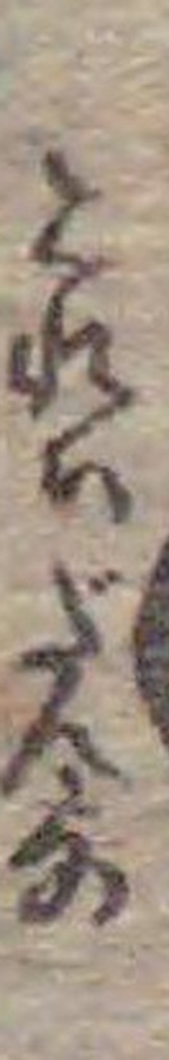これはだんな
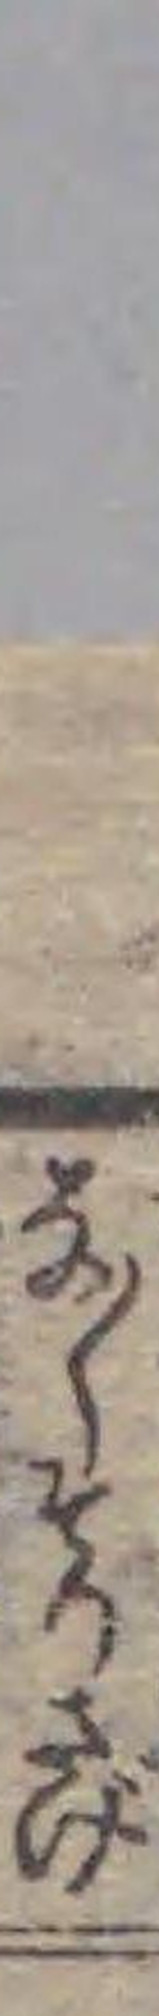な〳〵そりさげ
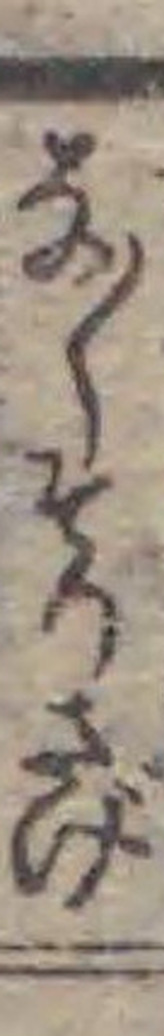な〳〵そりさげ
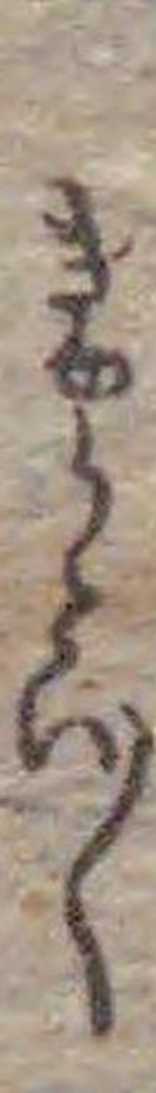きゆうとい？〳〵
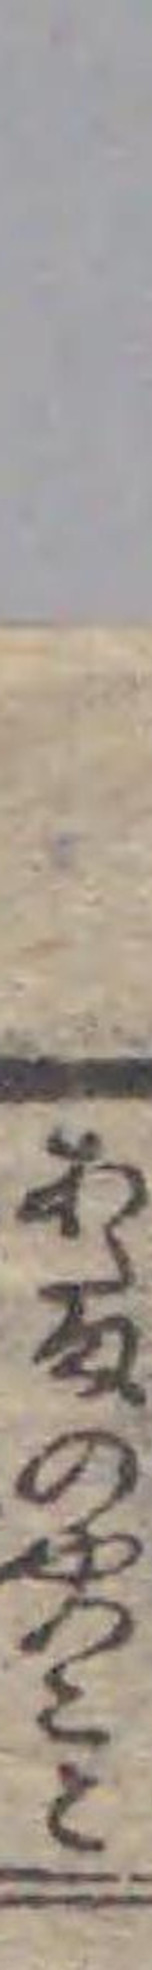あたまのやつこと
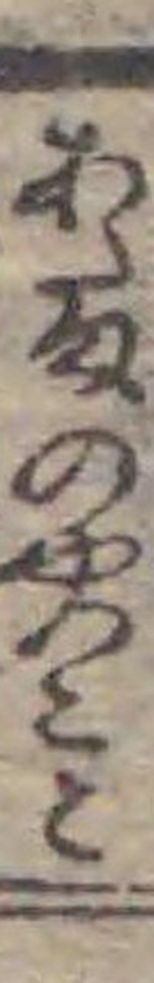あたまのやつこと
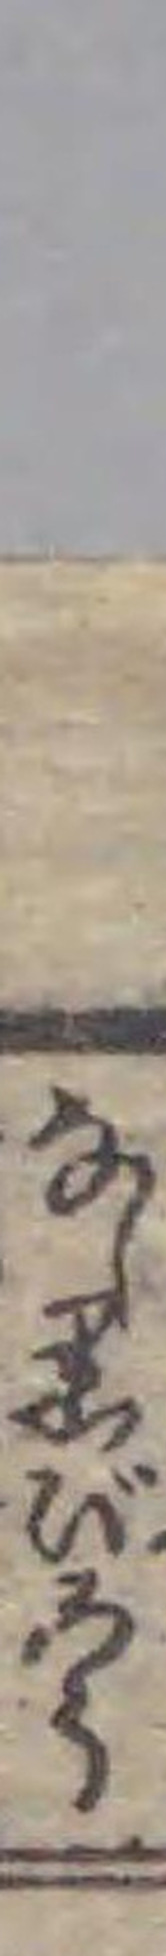なし黒びろう
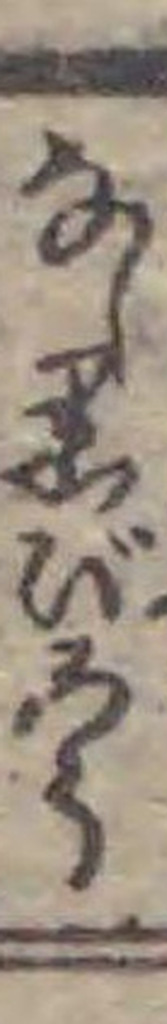なし黒びろう
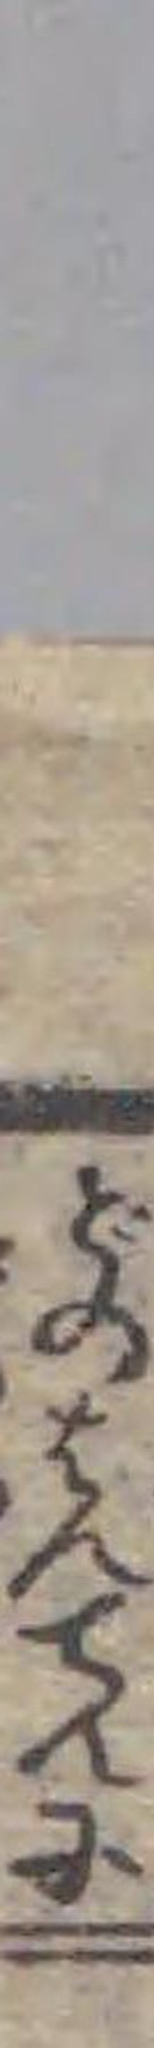どのはんてんに
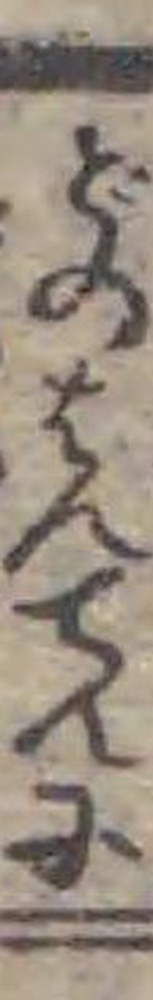どのはんてんに
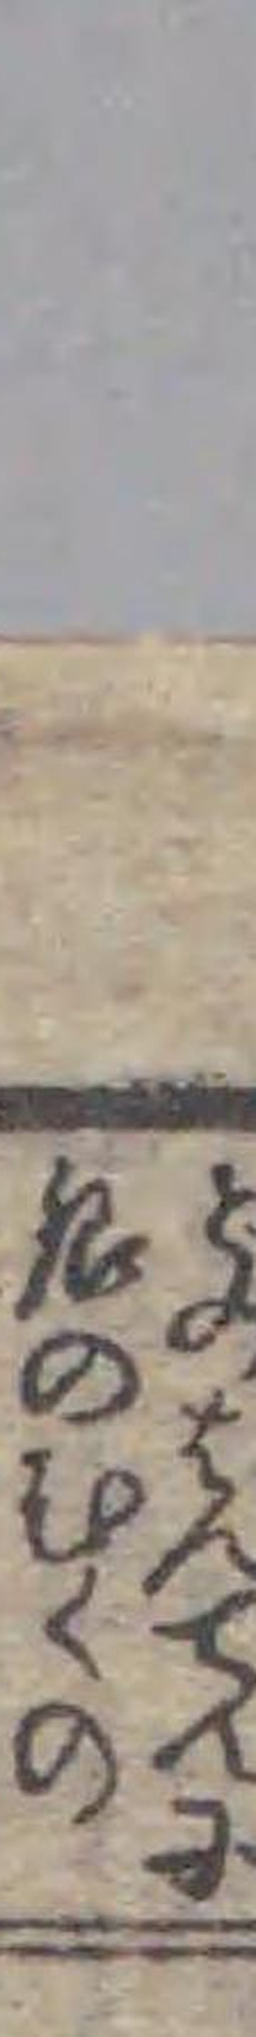銀のむくの
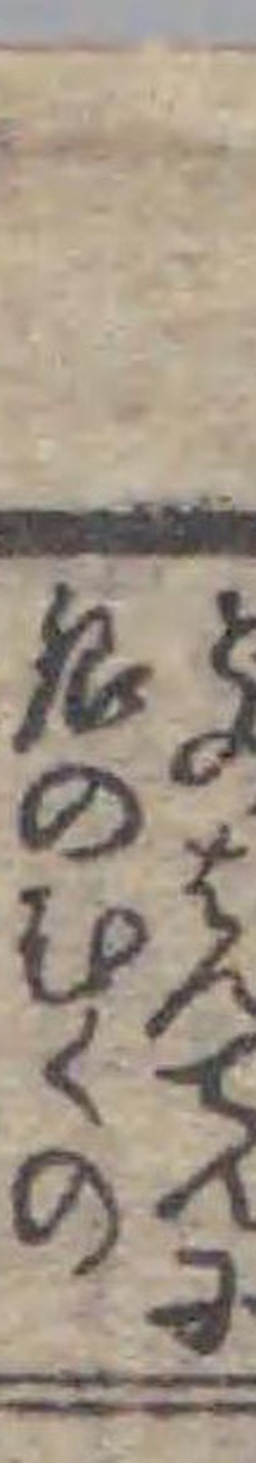銀のむくの
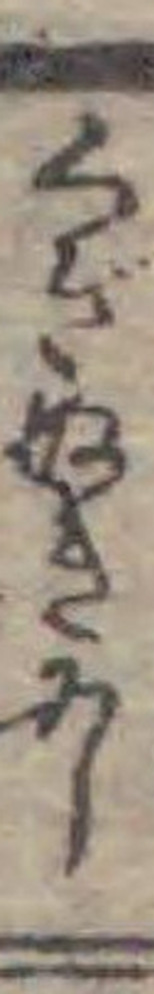くぎぬきにし
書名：見徳一炊夢 : 3巻
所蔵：国立国会図書館 National Diet Library, JAPAN
